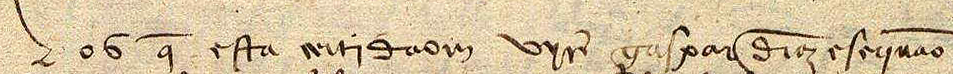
Aos q̄ esta certjdaom vyrē gaspar diaz escrjuão
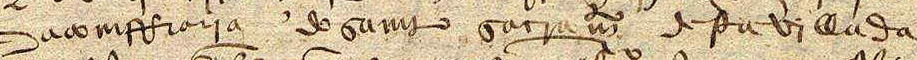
da comffrarja do samto sacramto desta villa da
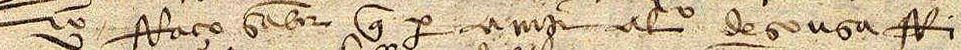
vro ffaço saber q̄ ꝑamte aLro de sousa ffi
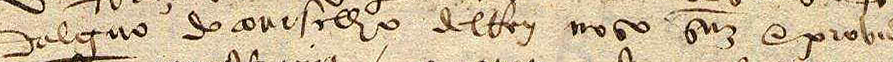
dalguo do comselho del Rey noso s̄or e provedor
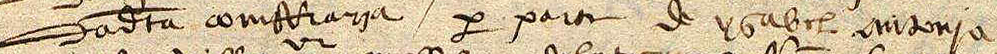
da d̄ta comffrarja / ꝑ parte de ysabel Antonja
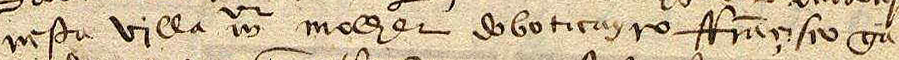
nesta vjlla mor molher do boticayro ffrançisco ga
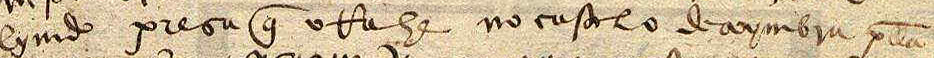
lymdo presa q̄ ora he no castelo de coymbra p̄lla
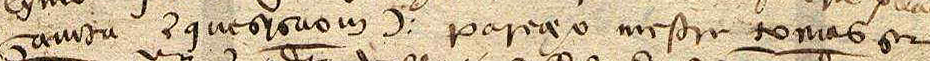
samta ēquesysaom /: pareçeo mestre tomas seu
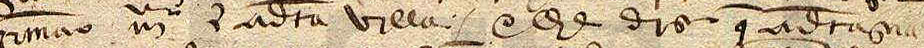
Jrmão mor ē a d̄ta villa:/ e lhe dise q̄ a d̄ta sua
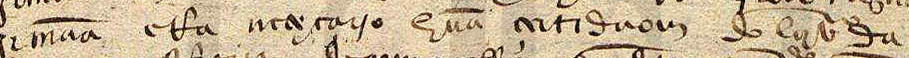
Jrmāa eRa neceçarjo hūa certidaom do lyvro da
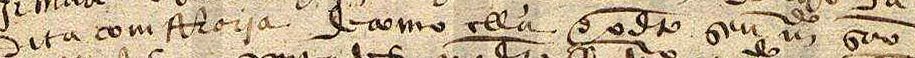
dita comffrarja de como ella e o d̄to seu mdo são
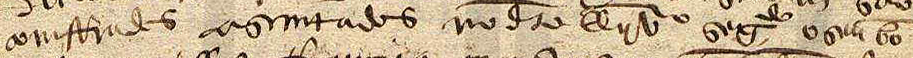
comffrades asemtados no d̄to llyvro segdo o seu bō
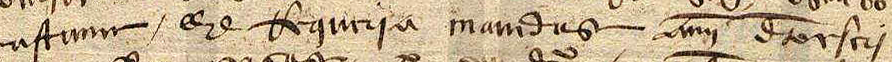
custume / lhe Requerja mamdase a mj̄ dt̄o escrj
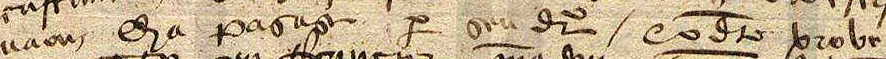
uaom lha pasase ꝑ seu dro / e o d̄to prove
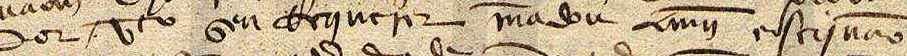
dor / vto seu Requerer m̄adou a m̄j escrjuão
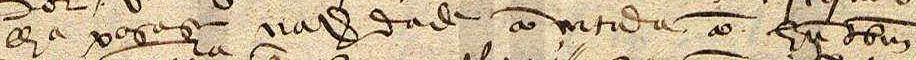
lha pasase na ꝟdade c̄ocertada c̄o hū t̄bm
